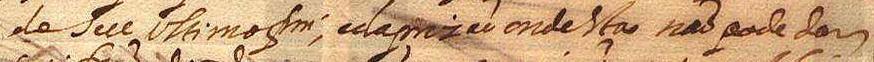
do seu vltimo fim, e da prizaõ onde esta naõ pode dar
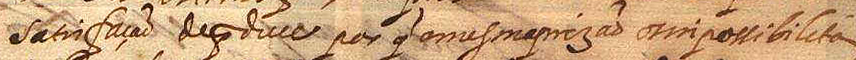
satisfaçaõ de q̄ deue porq̄ a mesma prizaõ os impossibilita
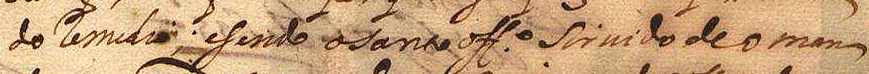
do Remedio; e sendo o santo off.o siruido de o man
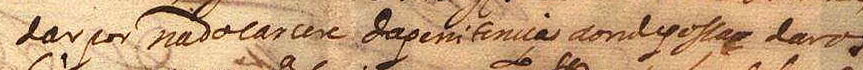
dar por na do carcere da penitencia aonde possa dar os
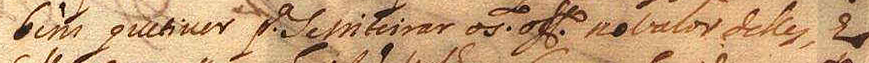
bens que tiuer p.a se inteirar o s.to off.o no valor delles, E
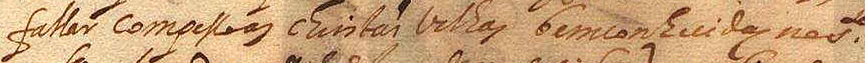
fallar com pessoas christās velhas bem conhecidas no s.to
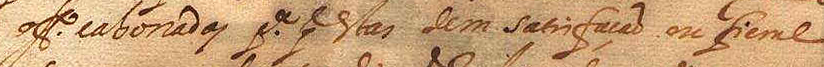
off.o e abonadas p.a q̄ estas dem satisfaçaõ ou fieral
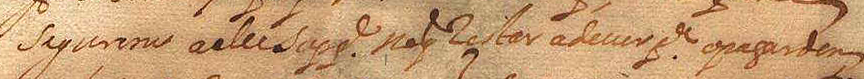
segurem a elle supp.e no q̄ Restar a deuer p.a o pagar den
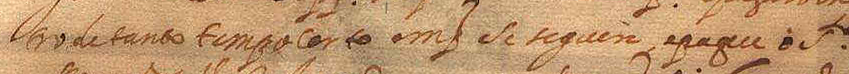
tro de tanto tempo certo em q̄ se seguir, e pague o S.to
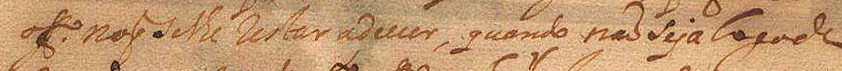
off.o no q̄ se lhe Restar a deuer, quando naõ seja logo de
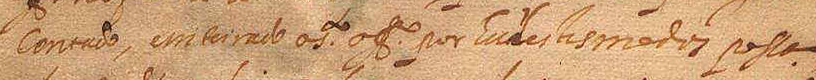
contado, e inteirado o s.to off.o por hū destes modos possa
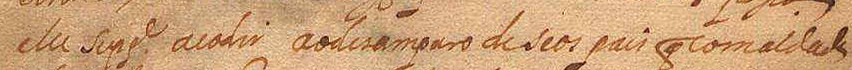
elle supp.e acodir ao desamparo de seos pais q̄ com a idade
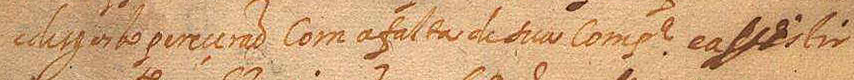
e desgosto pereceraõ com a falta de sua compa. e assistir
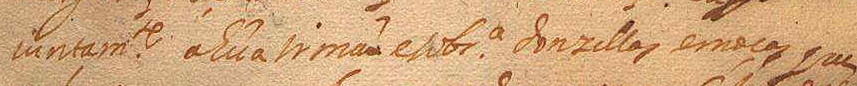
iuntam.te a hūa irmaā e sobr.a donzellas e moças que
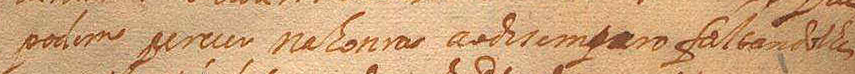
podem perecer na honra ao desemparo faltandolhe
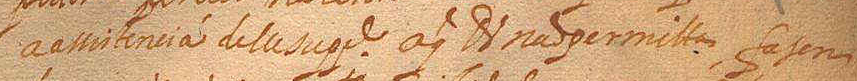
a assistencia delle supp.e o q̄ Ds̄ naõ permitta, fasen
